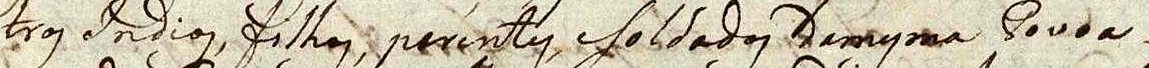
tros Indios, filhos, parentes e soldados da mesma Povoa
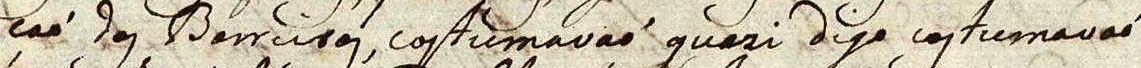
çaõ dos Barreiros , costumavaõ quazi digo costumavaō
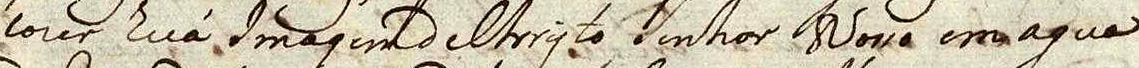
cozer huā Imagem de Christo Senhor Nosso em agua
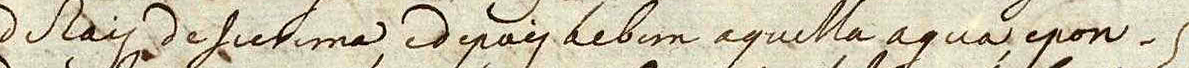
de Rais de Jurema, e depois bebem aquella agua, e pon
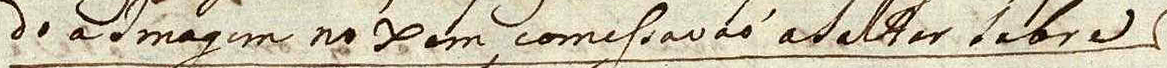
do a Imagem no xam, comessavaõ a Saltar Sobre
